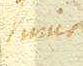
uiua
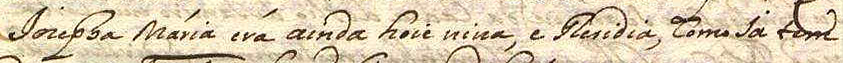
Iozepha Maria era ainda hoie uiua, e Residia, Como Ia tem
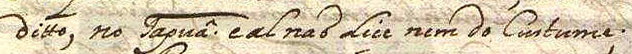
ditto, no Tapuâ. e al naõ dice nem do Custume.
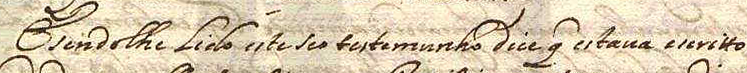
E sendolhe Lido este seo testemunho dice q̄ estaua escritto
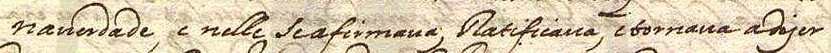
na uerdade, e nelle se afirmaua, Ratificaua, e tornaua a dizer
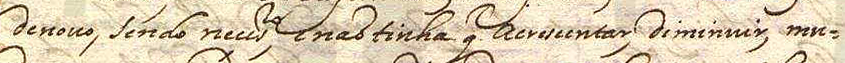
de nouo, sendo necesro, e naõ tinha q̄ acrescentar, diminuir, mu
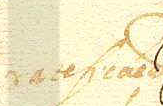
rateficaçaõ
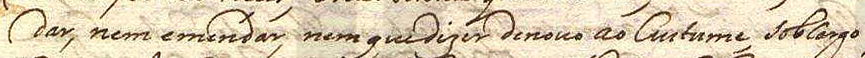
dar, nem emendar, nem que dizer de nouo ao Custume, sob cargo
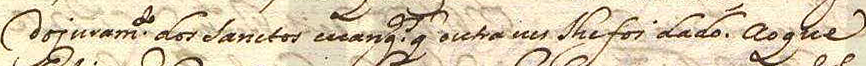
do juram.to dos Sanctos euang.os q̄ outra ues lhe foi dado. ao que
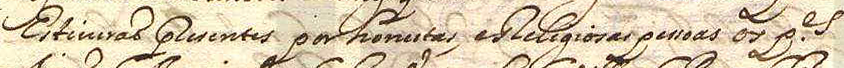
Estiueraõ presentes por honestas, e Religiosas pessoas os p.es
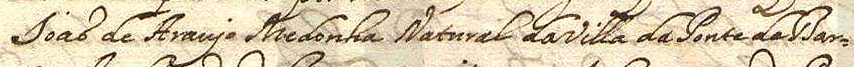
Ioaõ de Araujo Medonha Natural da villa da Ponte de Bar
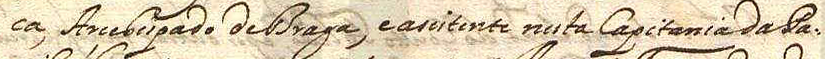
ca, Arcebispado de Braga, e asistente nesta Capitania da Pa
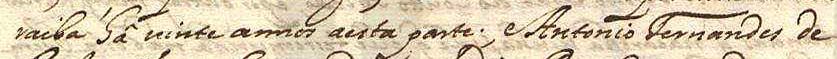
raiba hâ uinte annos a esta parte; e Antonio Fernandes de
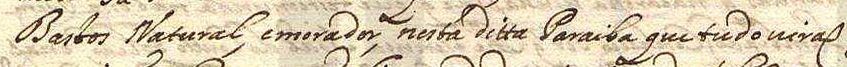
Bastos Natural, e morador, nesta ditta Paraiba, que tudo uiraõ
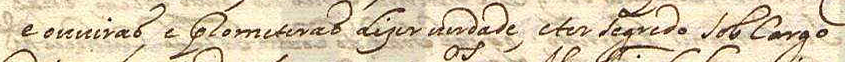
e ouuiraõ, e prometeraõ dizer uerdade, e ter segredo sob Cargo
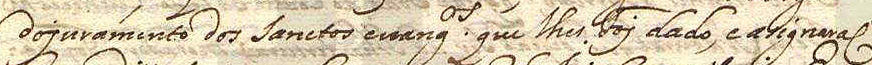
do juramento dos Sanctos euang.os que lhes Foj dado, e asignaraõ
